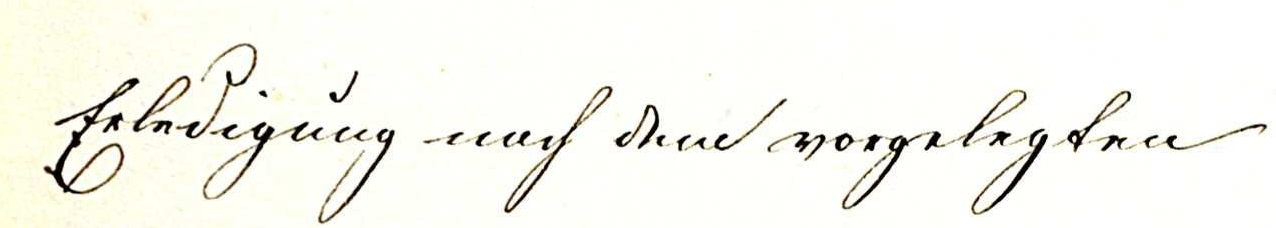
Erledigung nach dem vorgelegten
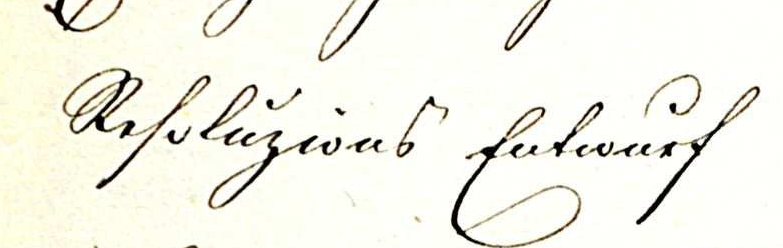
Resoluzions Entwurf
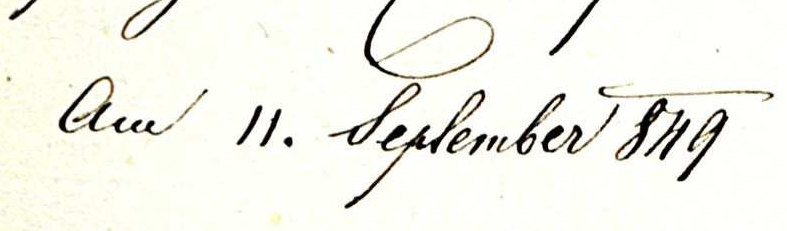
Am 11. September 849
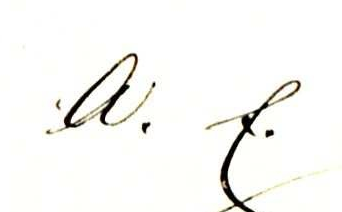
A. E.
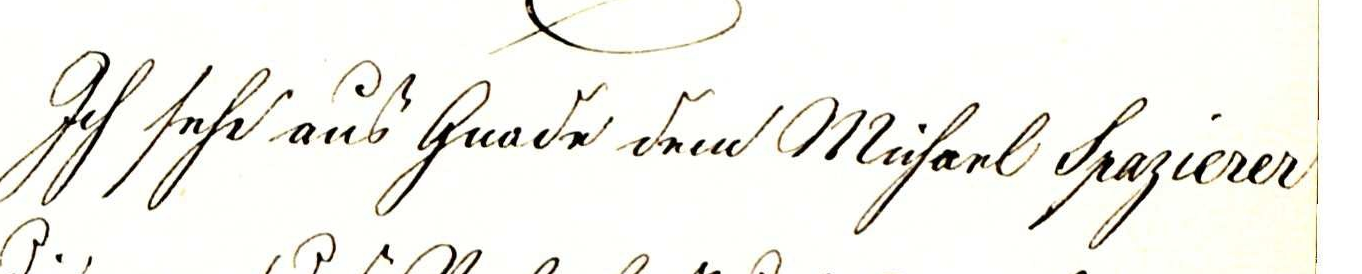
Ich sehe aus Gnade dem Michael Spazierer
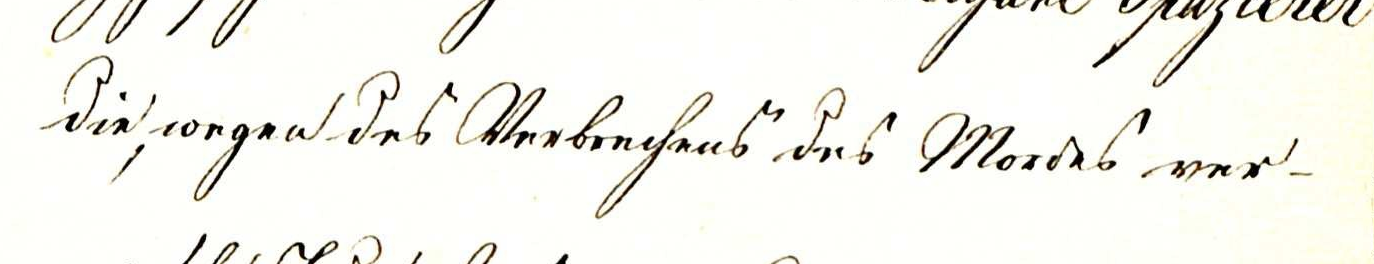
die, wegen des Verbrechens des Mordes ver¬
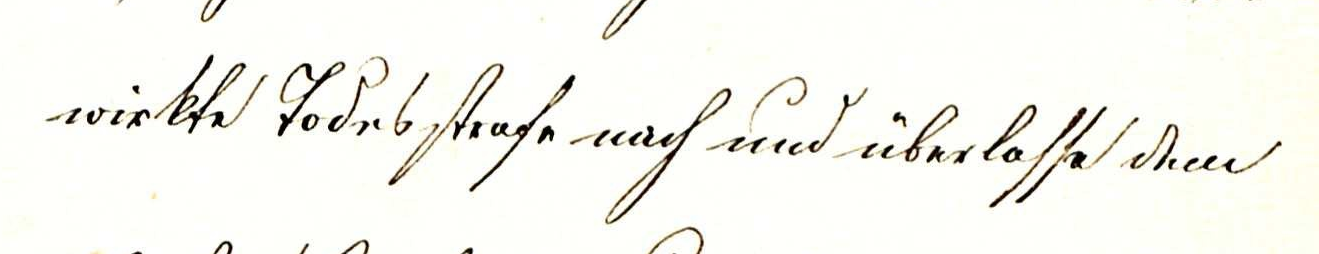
wirkte Todesstrafe nach und überlasse dem
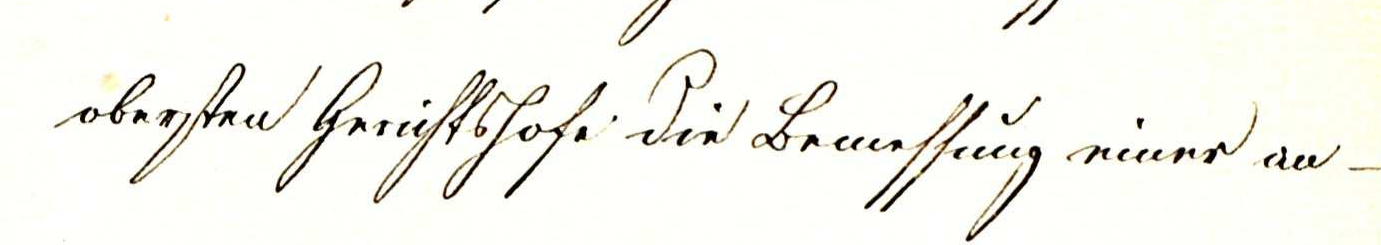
obersten Gerichtshofe die Bestimmung einer an¬
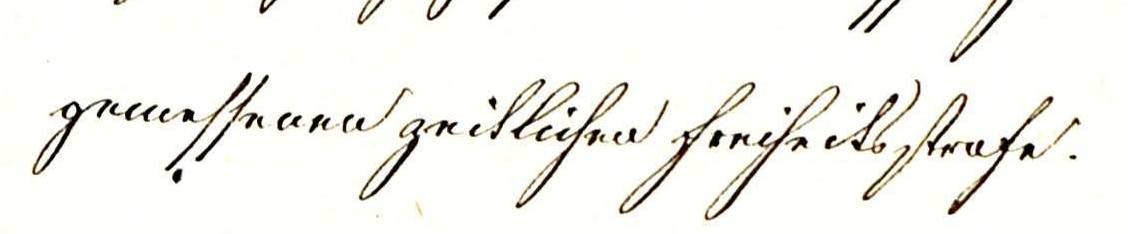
gemessenen zeitlichen Freiheitsstrafe.
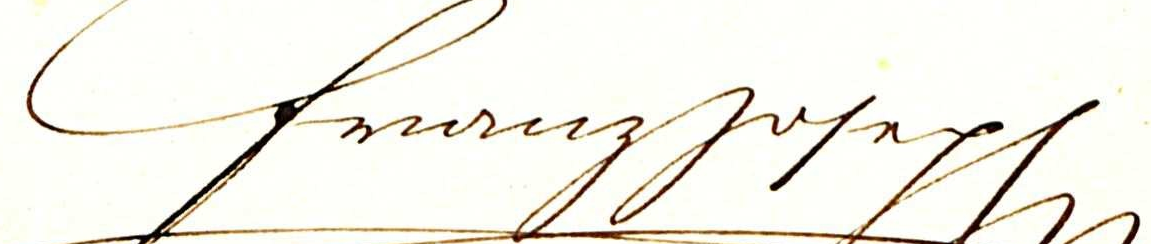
Franz Joseph
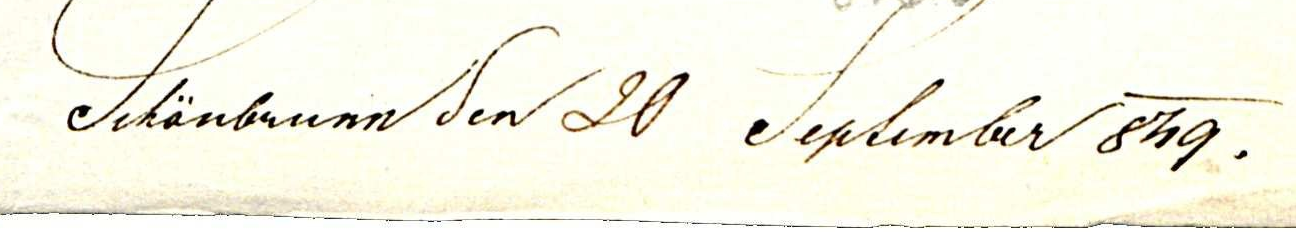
Schönbrunn den 20. September 849
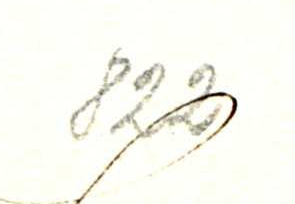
822
